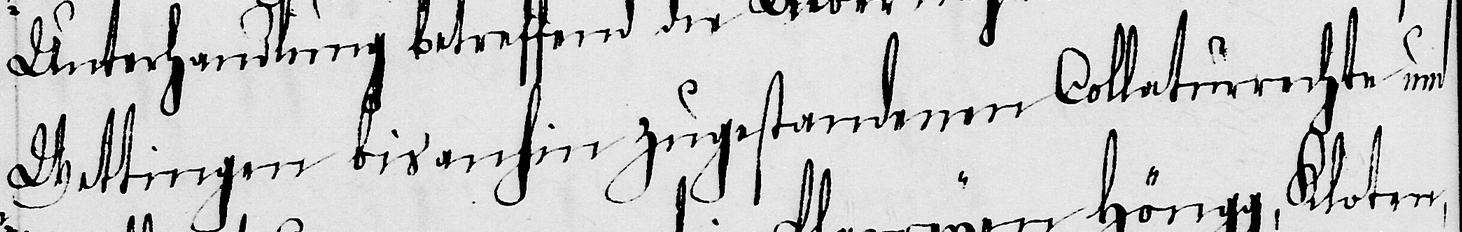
Wettingen bisanhin zugestandenen Collaturrechte und
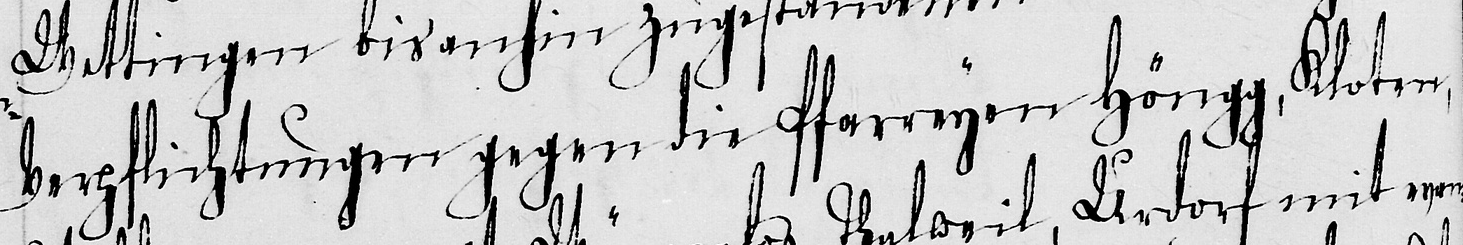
Verpflichtungen gegen die Pfarreyen Höngg, Kloten,
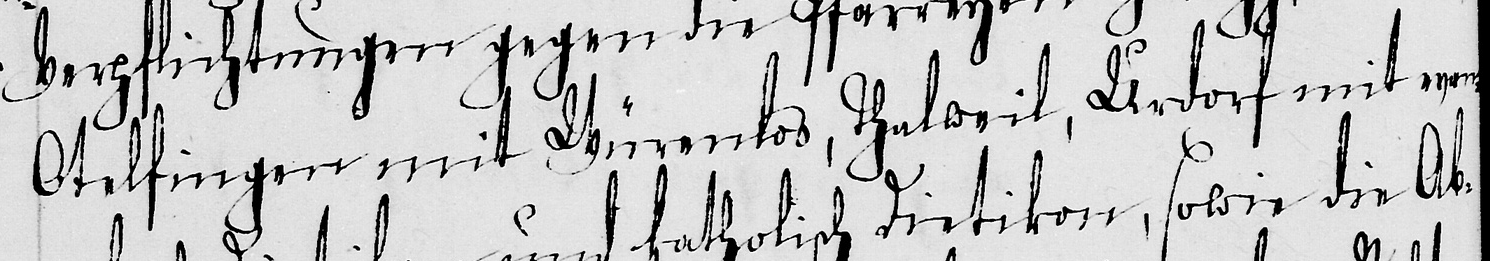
Otelfingen mit Würenlos, Thalweil, Urdorf mit evan¬
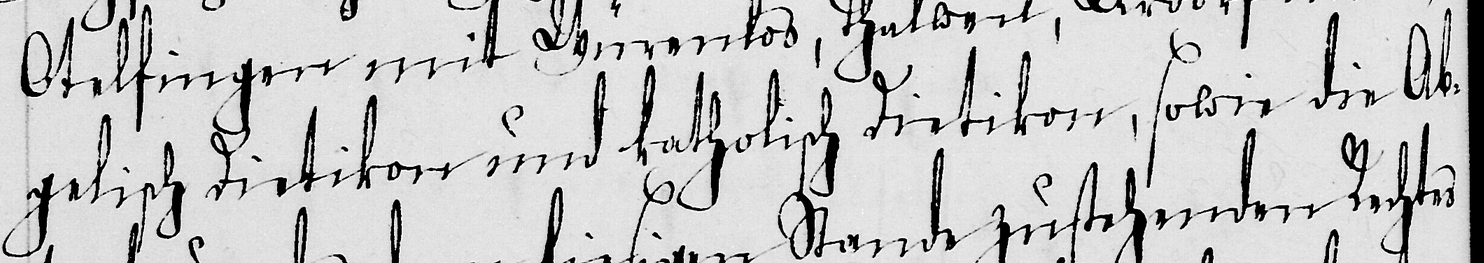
gelisch Dietikon und katholisch Dietikon, sowie die Ab¬
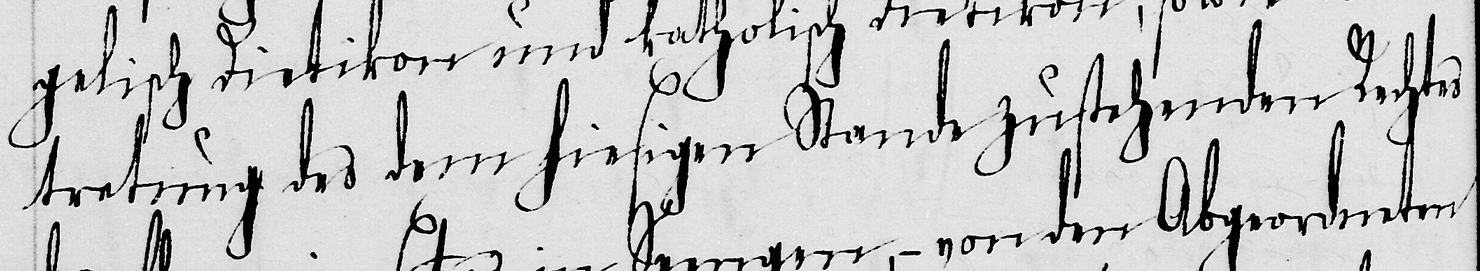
tretung des dem hiesigen Stande zustehenden Rechtes
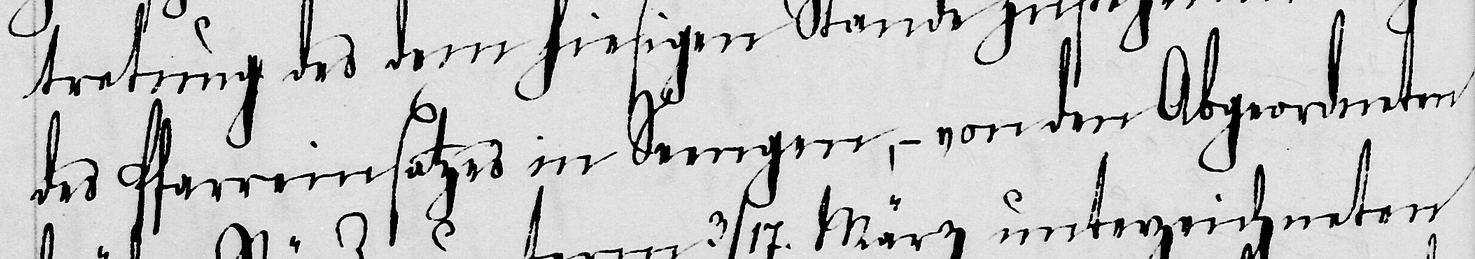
des Pfarreinsatzes in Seengen, – von den Abgeordneten
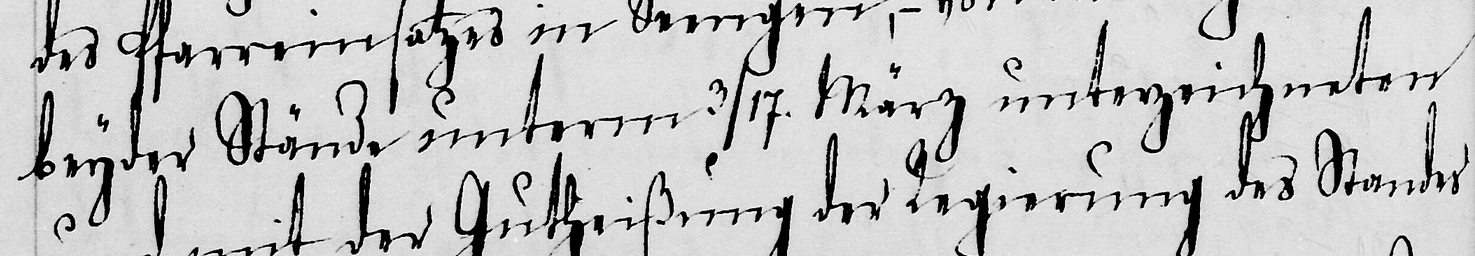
beyder Stände unterm 3/17. März unterzeichneten
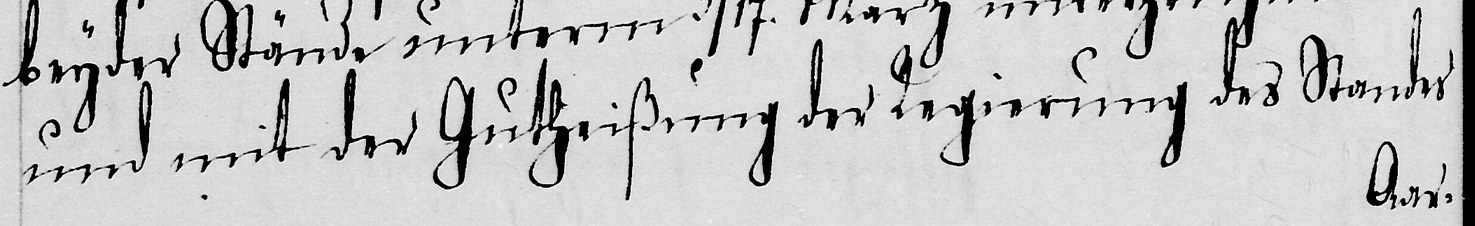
und mit der Gutheißung der Regierung des Standes
